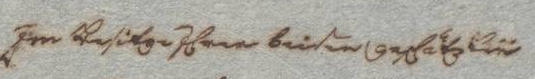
Im Besitze Ihrer beiden geschätzten
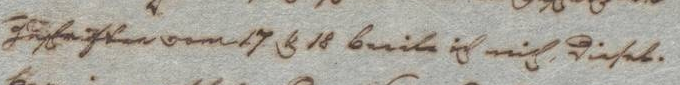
Zuschriften vom 17 & 18 beeile ich mich, diesel-
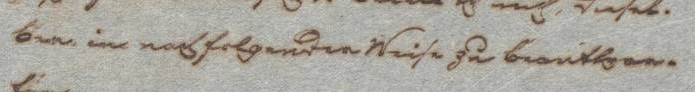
ben in nachfolgender Weise zu beantwor-
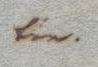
ten.
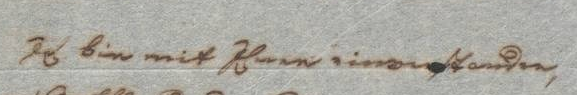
Ich bin mit Ihnen einverstanden,
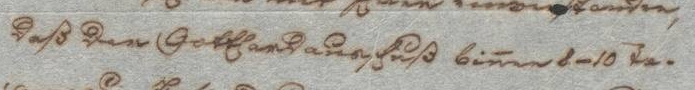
daß der Gotthardausschuß binnen 8-10 Ta-
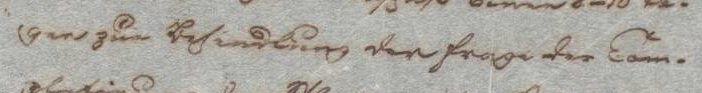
gen zur Behandlung der Frage der Com-
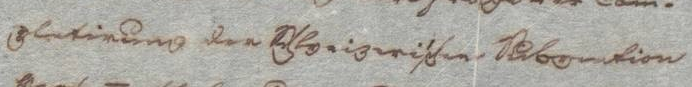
pletirung der Schweizerischen Subvention
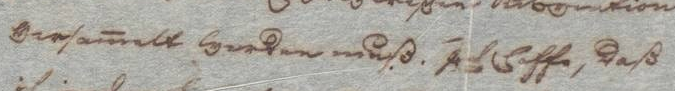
versammelt werden muß. Ich hoffe, daß
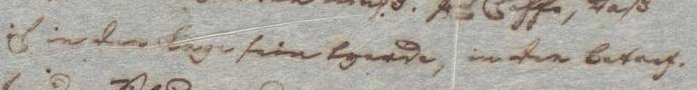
ich in der Lage sein werde, in der betref-
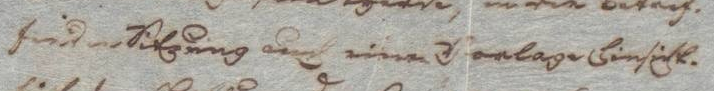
fenden Sitzung auch eine Vorlage hinsicht-
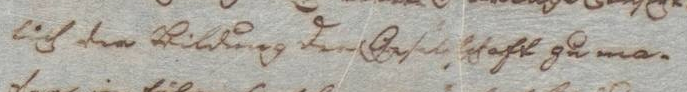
lich der Bildung der Gesellschaft zu ma-
